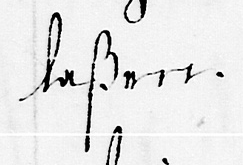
laßen.
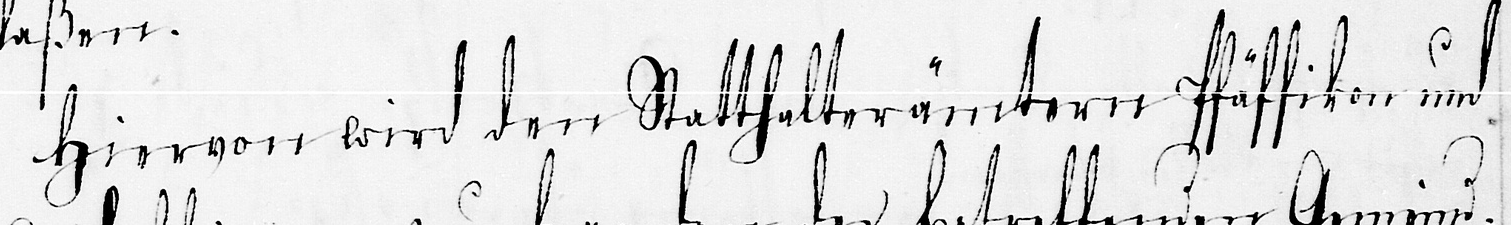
Hiervon wird den Statthalterämtern Pfäffikon und
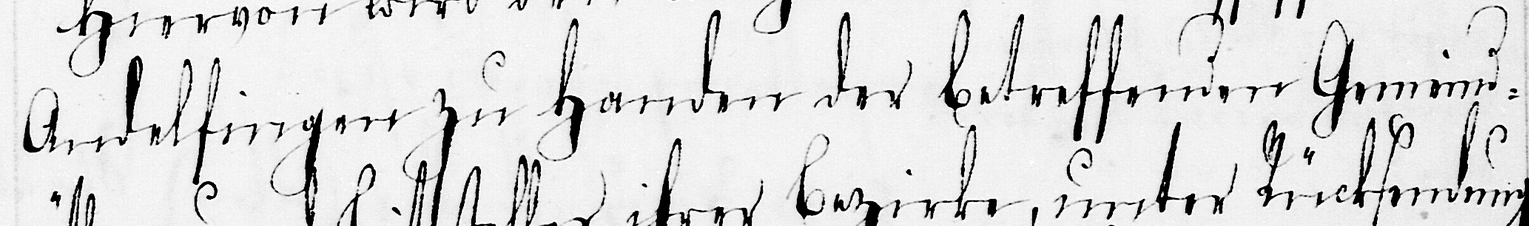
Andelfingen zu Handen der betreffenden Gemeind¬
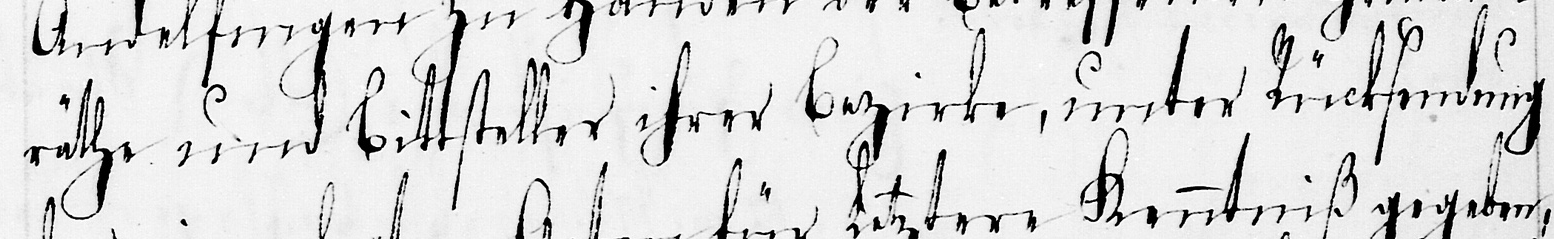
räthe und Bittsteller ihrer Bezirke, unter Rücksendung
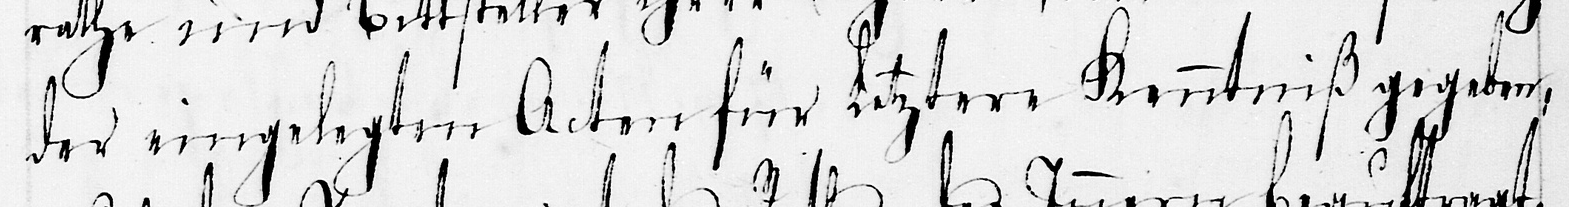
der eingelegten Acten für Letztere Kenntniß gegeben,
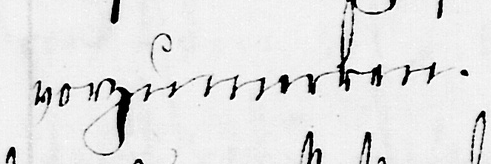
vorzumerken.
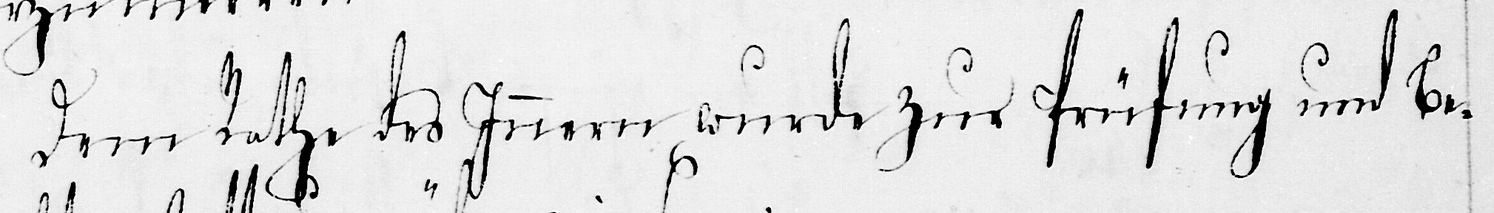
Dem Rathe des Innern wurde zur Prüfung und Be¬
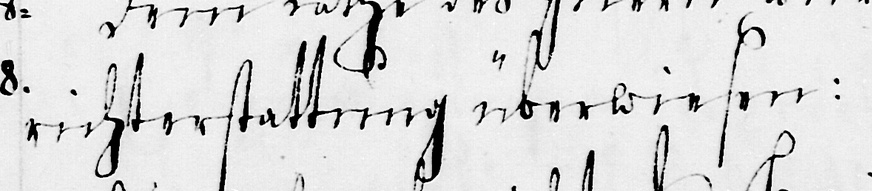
richterstattung überwiesen:
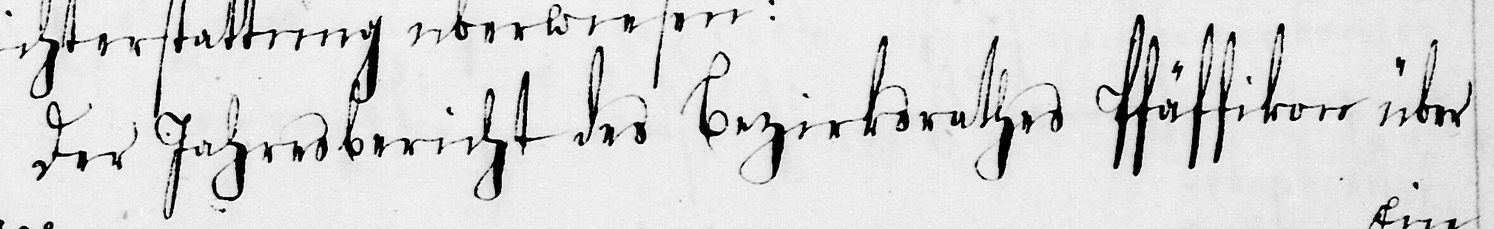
Der Jahresbericht des Bezirksrathes Pfäffikon über
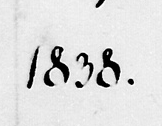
1838.
